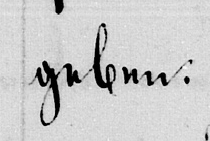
geben.
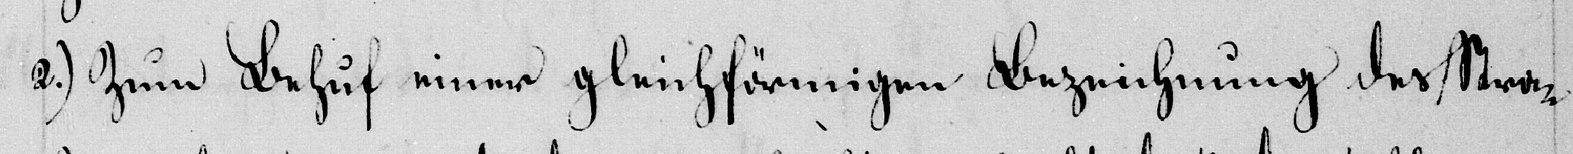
2.) Zum Behuf einer gleichförmigen Bezeichnung des Stra¬
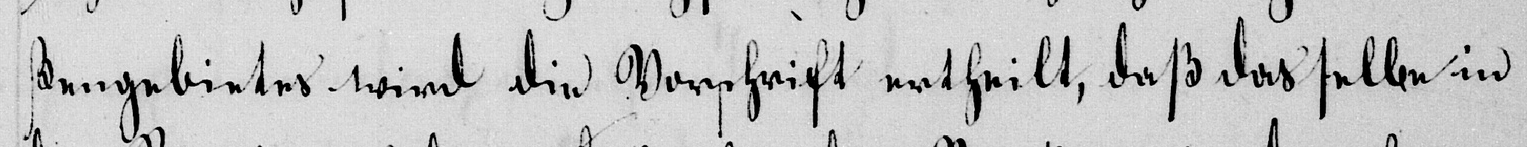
ßengebietes wird die Vorschrift ertheilt, daß das selbe in
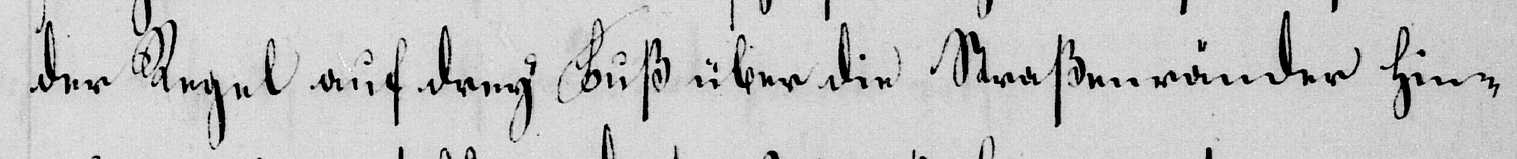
der Regel auf drey Fuß über die Straßenränder hin¬
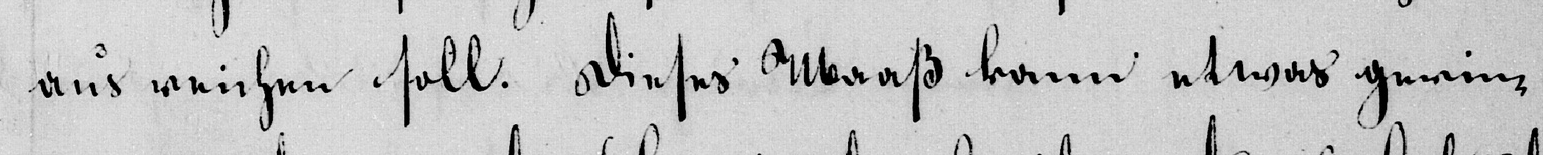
aus weichen soll. Dieses Maaß kann etwas gerin¬
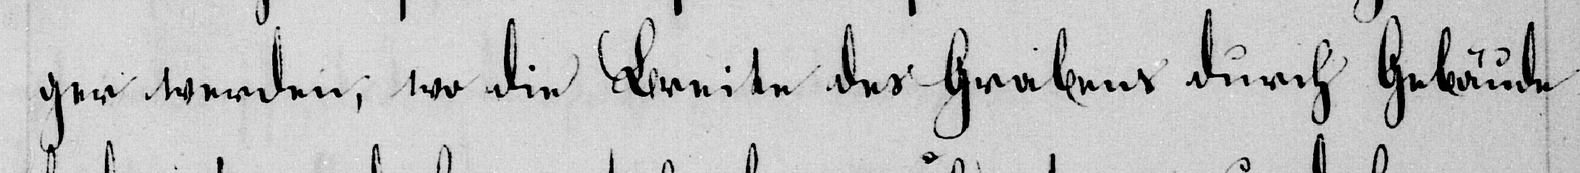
ger werden, wo die Breite des Grabens durch Gebäude
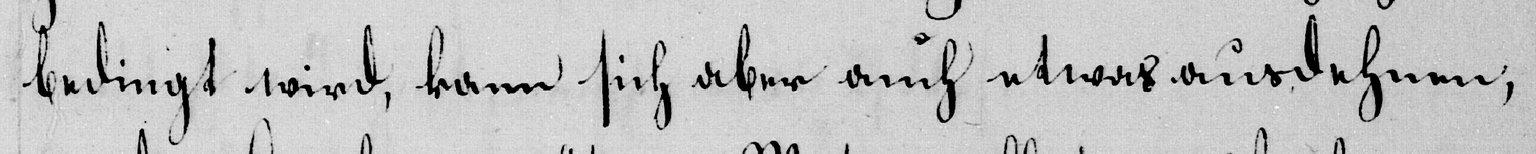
bedingt wird, kann sich aber auch etwas ausdehnen,
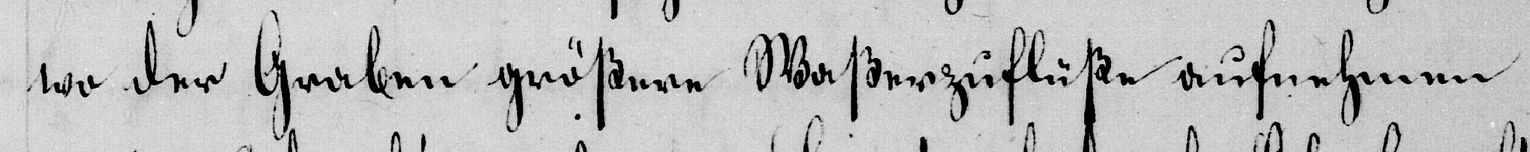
wo der Graben größere Waßerzuflüße aufnehmen
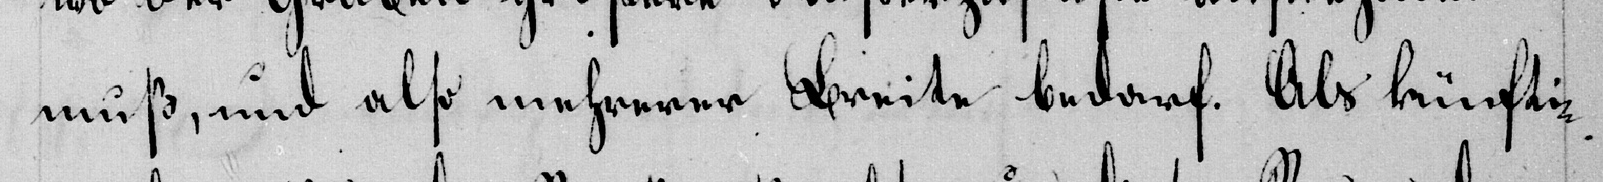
muß, und also mehrerer Breite bedarf. Als künfti¬
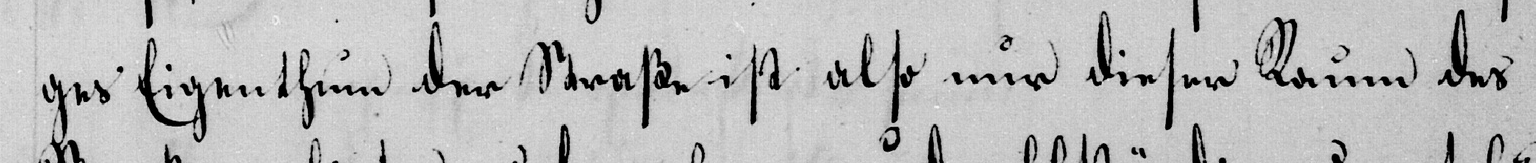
ges Eigenthum der Straße ist also nur dieser Raum des
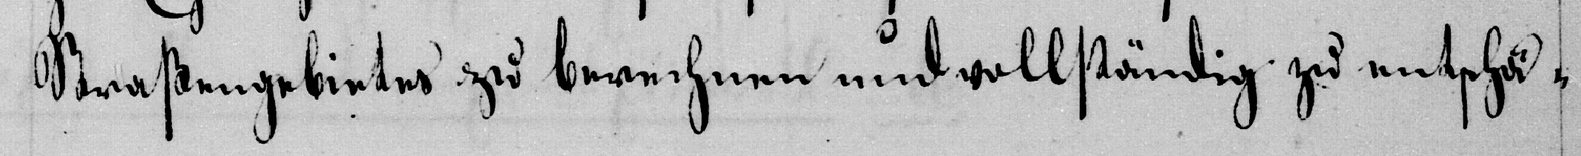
Straßengebietes zu berechnen und vollständig zu entschä-
